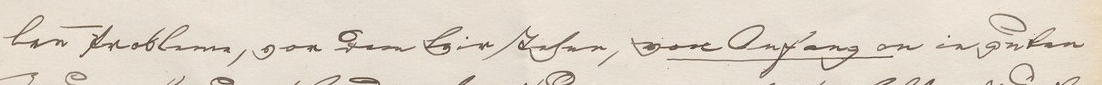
len Probleme, vor dem wir stehen, von Anfang an in guten
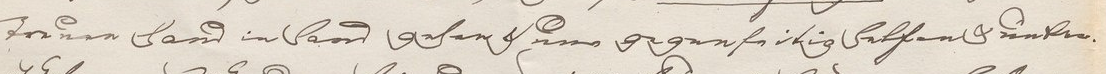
Treuen Hand in Hand gehen & uns gegenseitig helfen & unter-
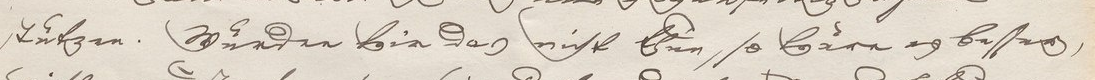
stützen. Würden wir das nicht thun, so wäre es besser,
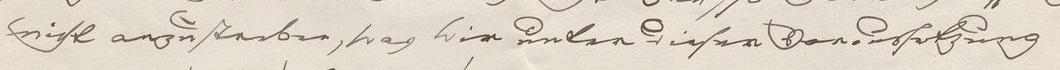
nicht anzustreben, was wir unter dieser Voraussetzung
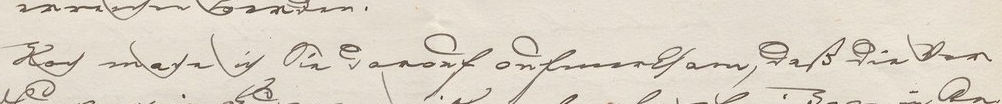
Noch mache ich Sie darauf aufmerksam, daß die Ver-
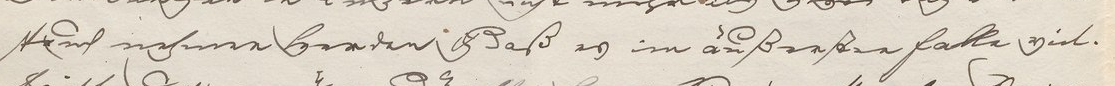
spruch nehmen werden & daß es im äußersten Falle viel-
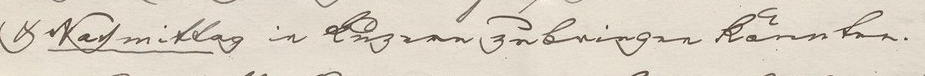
& Nachmittag in Luzern zubringen könnten.
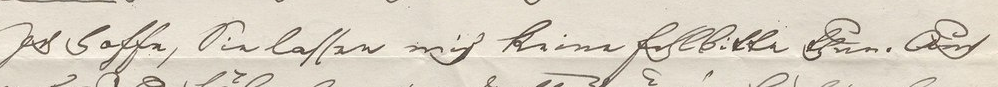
Ich hoffe, Sie lassen mich keine Fehlbitte thun. Auch
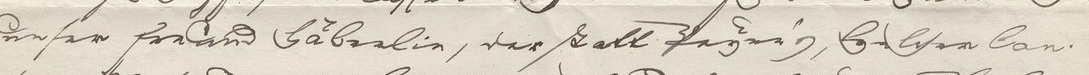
unser Freund Häberlin, der statt Peyer's, welcher lan-
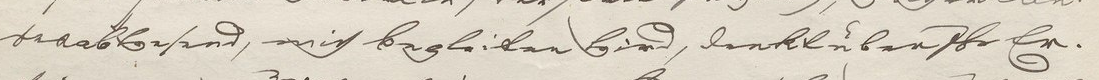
desabwesend, mich begleiten wird, denkt über Ihr Er-
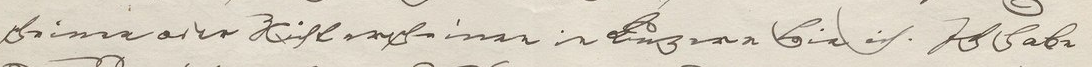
scheinen oder Nichterscheinen in Luzern wie ich. Ich habe
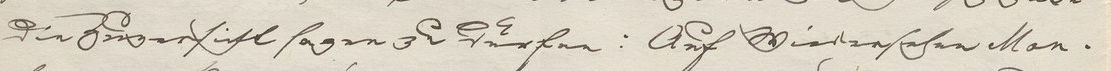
die Zuversicht sagen zu dürfen: Auf Wiedersehen Mon-
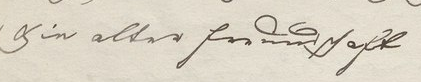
& in alter Freundschaft
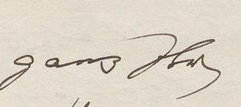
ganz Ihr
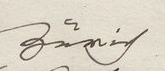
Zürich
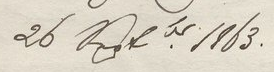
26. Septbr 1863.
